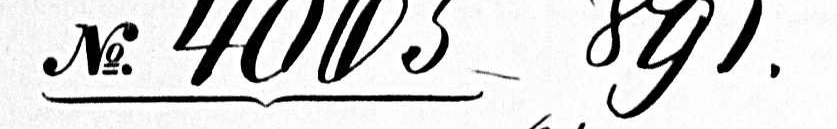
No 4065– 1891
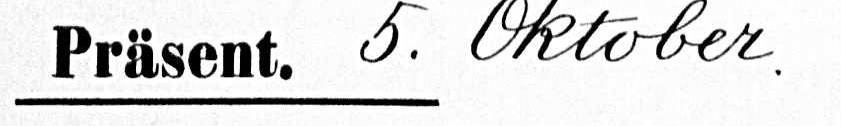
Präsent. – 5. Oktober
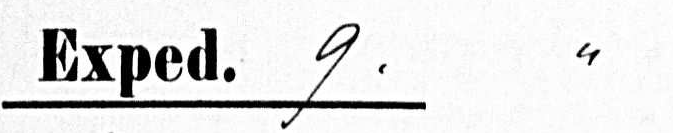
Exped. – 9. „
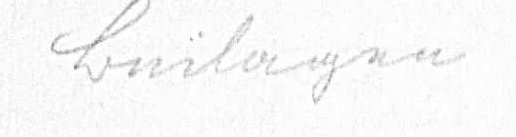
Beilagen
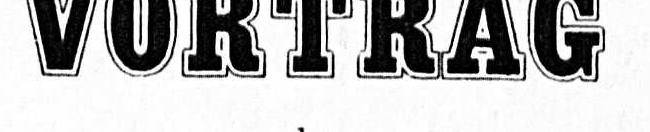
VORTRAG
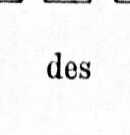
des
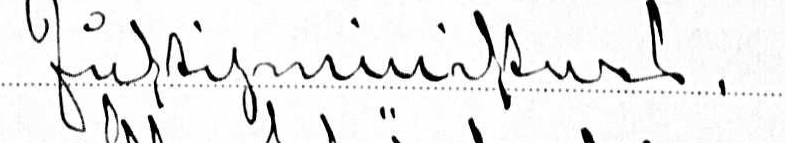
Justizministers,
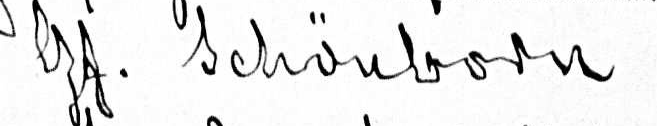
Gf. Schönborn
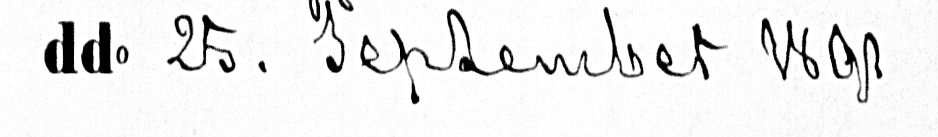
ddo 25. September 1891
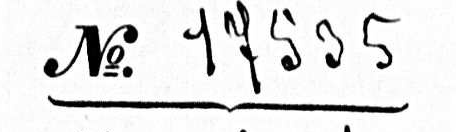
No. 17535
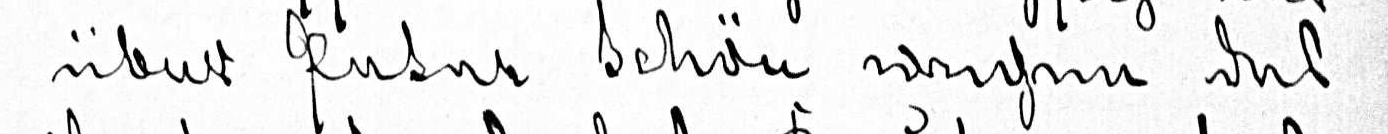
über Peter Schön wegen des
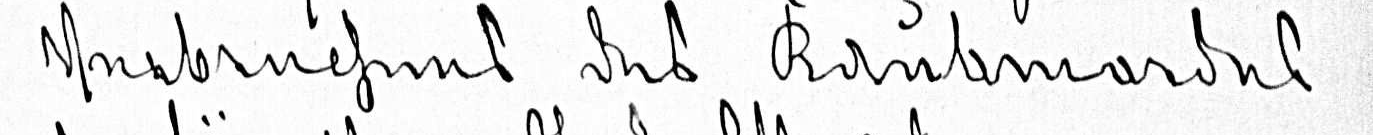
Verbrechens des Raubmordes
